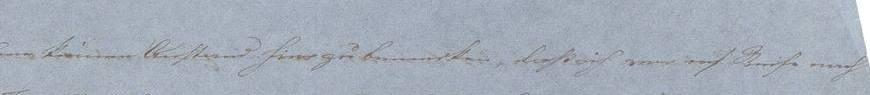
nehme keinen Anstand hier zu bemerken, daß ich vor meiner Reise nach
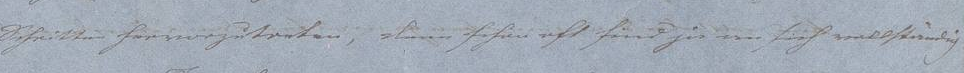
Schritten hervorzutreten, denn sehen oft sind ja an sich vollständig
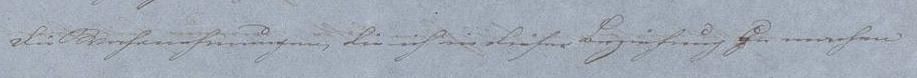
Die Wahrnehmungen, die ich in dieser Beziehung zu machen
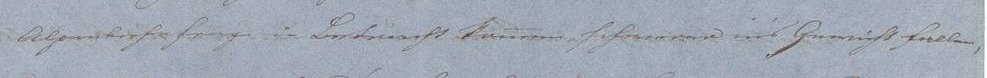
Alpenbahnfrage in Betracht kommen, schwerer in's Gewicht fallen,
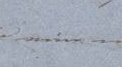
mir eine mit den
